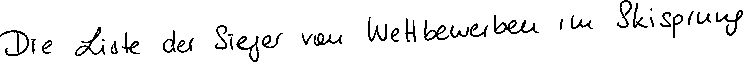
Die Liste der Sieger von Wettbewerben im Skisprung
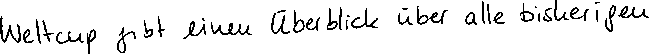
Weltcup gibt einen Überblick über alle bisherigen
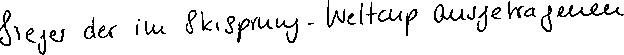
Sieger der im Skisprung-Weltcup ausgetragenen
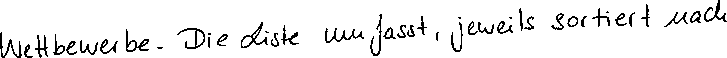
Wettbewerbe. Die Liste umfasst, jeweils sortiert nach
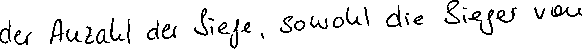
der Anzahl der Siege, sowohl die Sieger von
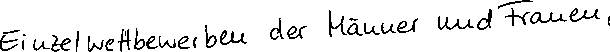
Einzelwettbewerben der Männer und Frauen,
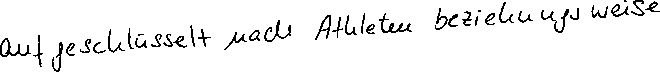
aufgeschlüsselt nach Athleten beziehungsweise
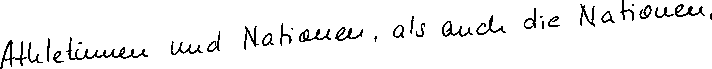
Athletinnen und Nationen, als auch die Nationen,
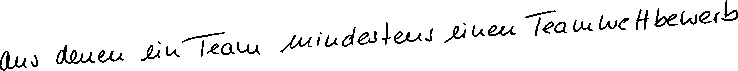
aus denen ein Team mindestens einen Teamwettbewerb
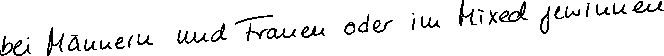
bei Männern und Frauen oder im Mixed gewinnen
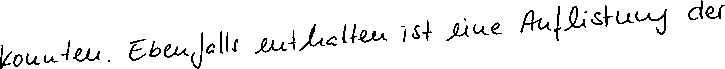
konnten. Ebenfalls enthalten ist eine Auflistung der
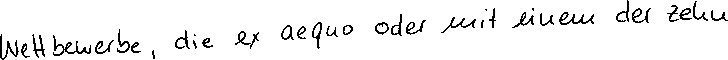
Wettbewerbe, die ex aequo oder mit einem der zehn
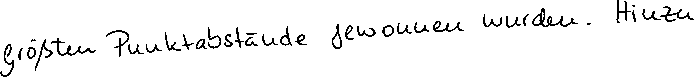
größten Punktabstände gewonnen wurden. Hinzu
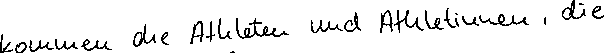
kommen die Athleten und Athletinnen, die
